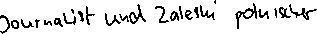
Journalist und Zaleski polnischer
